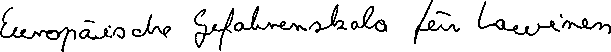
Europäische Gefahrenskala für Lawinen
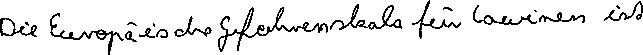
Die Europäische Gefahrenskala für Lawinen ist
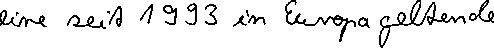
eine seit 1993 in Europa geltende
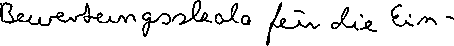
Bewertungsskala für die Ein-
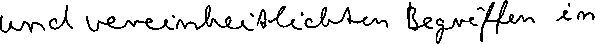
und vereinheitlichten Begriffen in
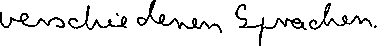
verschiedenen Sprachen.
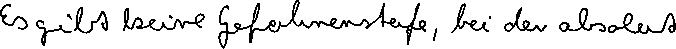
Es gibt keine Gefahrenstufe, bei der absolut
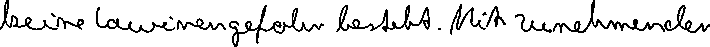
keine Lawinengefahr besteht. Mit zunehmender
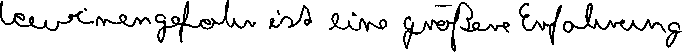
Lawinengefahr ist eine größere Erfahrung
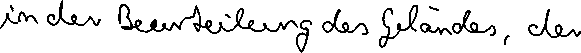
in der Beurteilung des Geländes, der
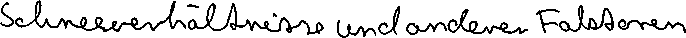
Schneeverhältnisse und anderer Faktoren
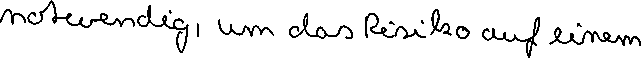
notwendig, um das Risiko auf einem
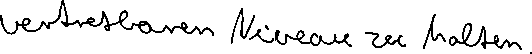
vertretbaren Niveau zu halten.
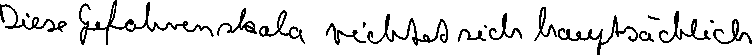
Diese Gefahrenskala richtet sich hauptsächlich
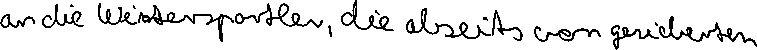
an die Wintersportler, die abseits von gesicherten
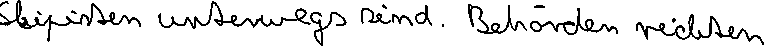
Skipisten unterwegs sind. Behörden richten
